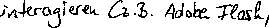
interagieren (z. B. Adobe Flash,
